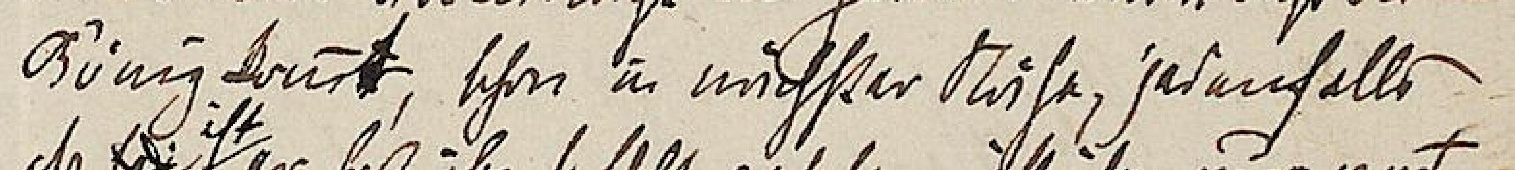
König komt, schon in nächster Nähe, jedenfalls
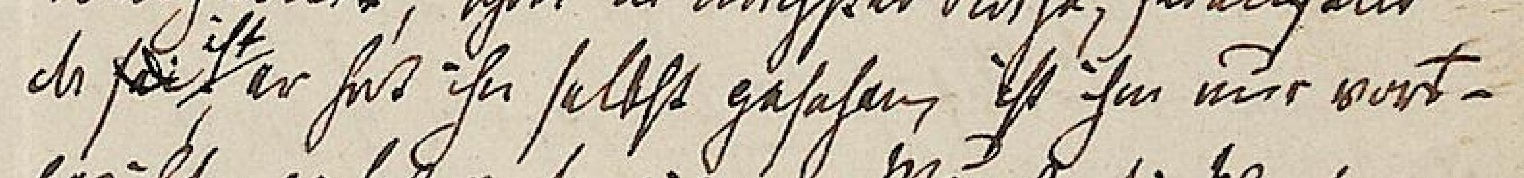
da sei ist, er hat ihn selbst gesehen, ist ihm nur vor¬
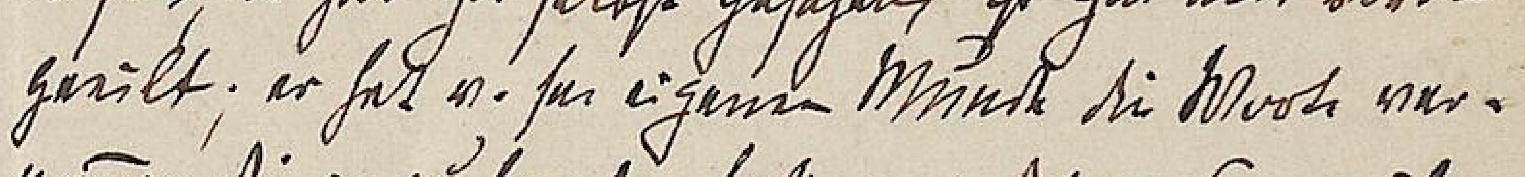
geeilt; er hat v. sm eigenen Munde die Worte ver¬
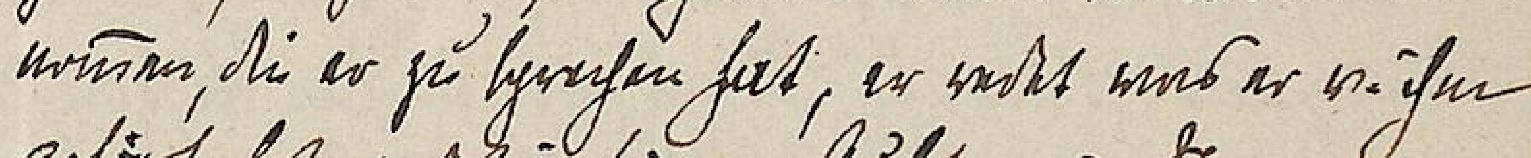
nomen, die er zu sprechen hat, er redet was er v. ihm
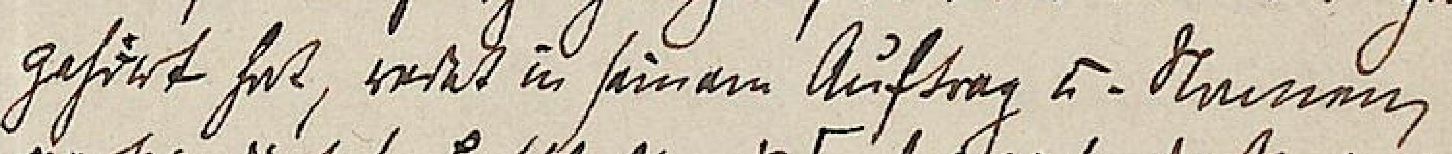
gehört hat, redet in seinem Auftrag u. Namen,
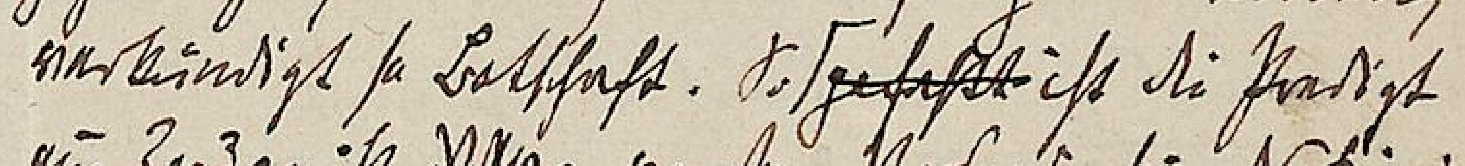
verkündigt sn Botschaft. So [gefaßt ist die Predigt
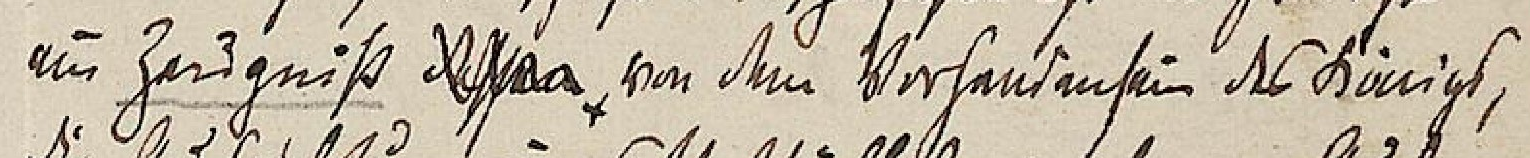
ein Zeugnis dessen, von dem Vorhandensein des Königs,
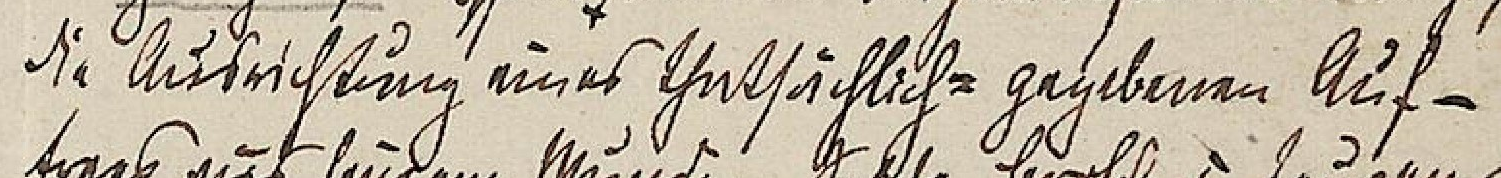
die Ausrichtung eines thatsächlich-gegebenen Auf¬
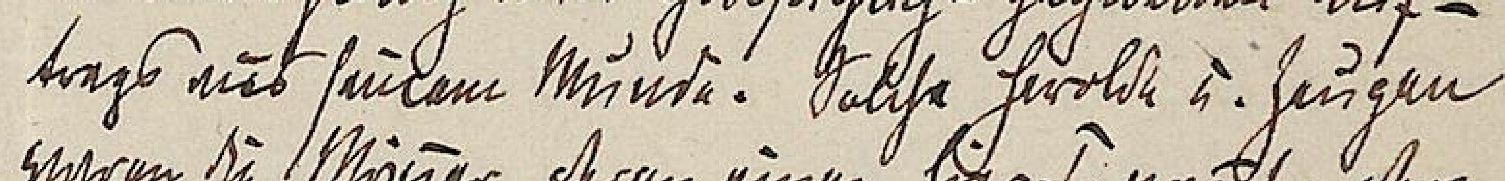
trags aus seinem Munde: Solche Herolde u. Zeugen
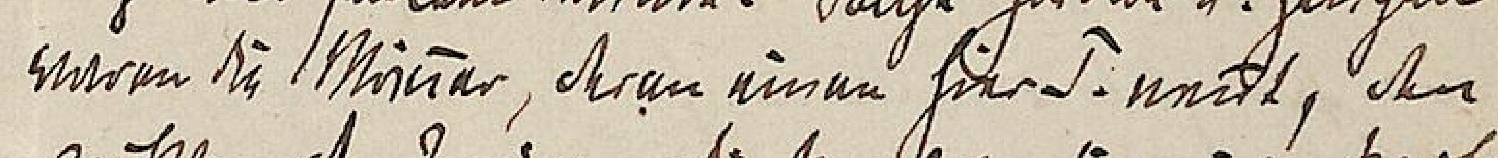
waren die Mäner, deren einen hier P. meint, den
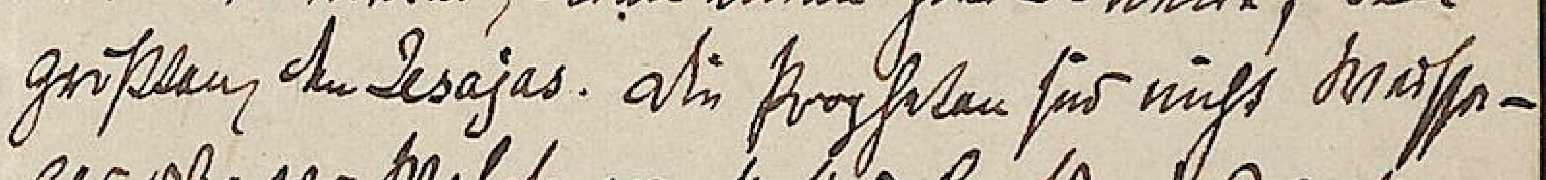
größten, den Jesajas. Die Propheten sind nicht Weissa¬
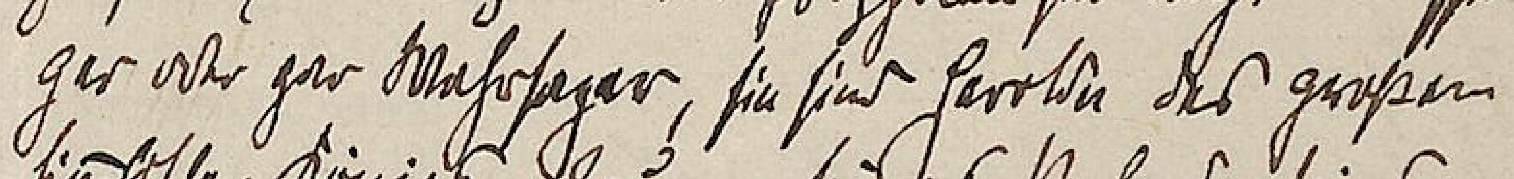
ger oder gar Wahrsager, sie sind Herolde des großen
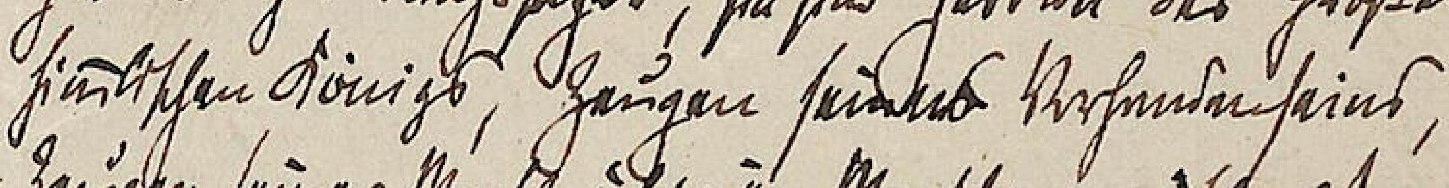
himlischen Königs, Zeugen seines Vorhandenseins,
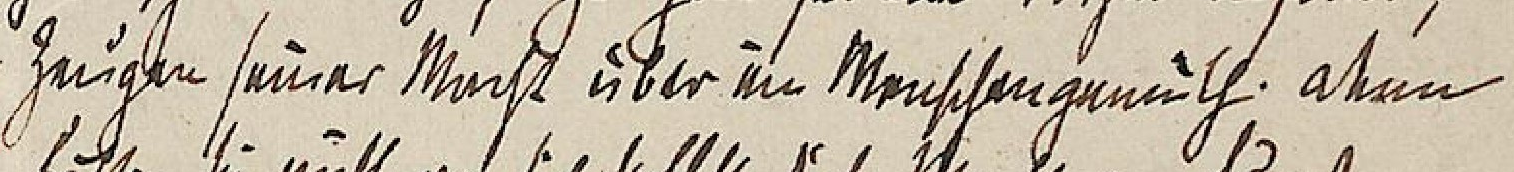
Zeichen seiner Macht über ein Menschengemüth. Denn
